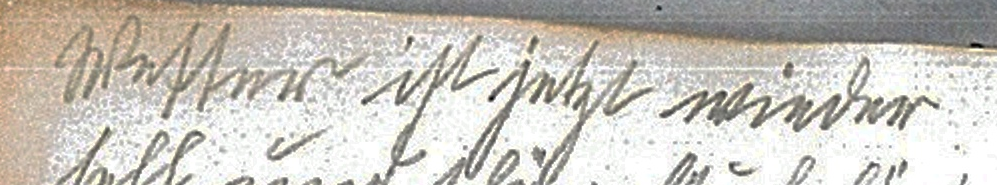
Wetter ist jetzt wieder
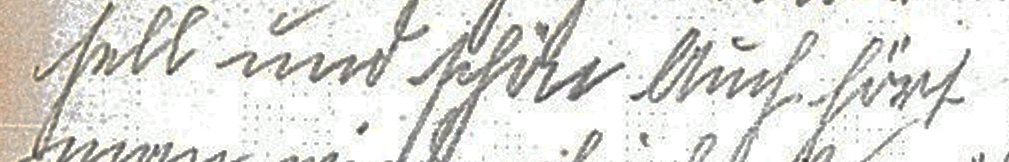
hell und schön Auch hört
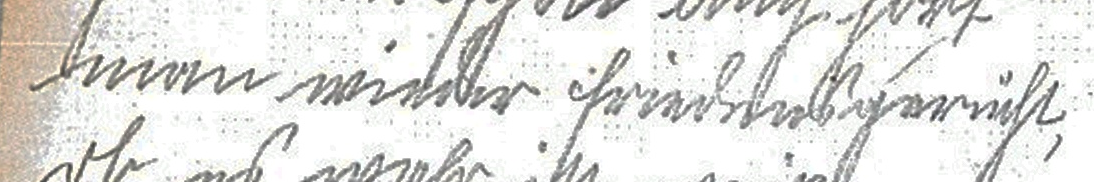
man wieder Friedensgerücht,
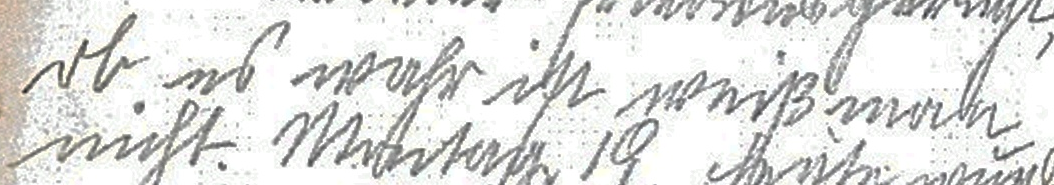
ob es wahr ist weiß man
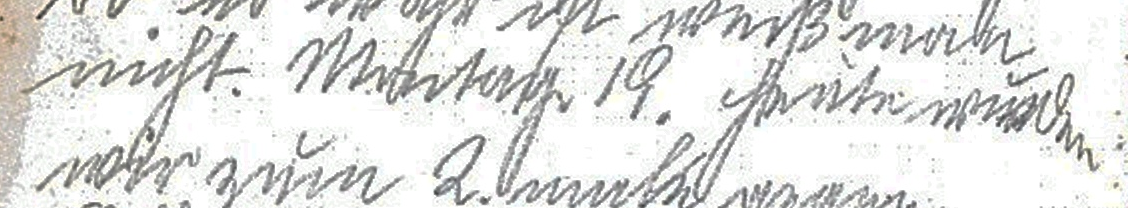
nicht. Montag 19. Heute wurden
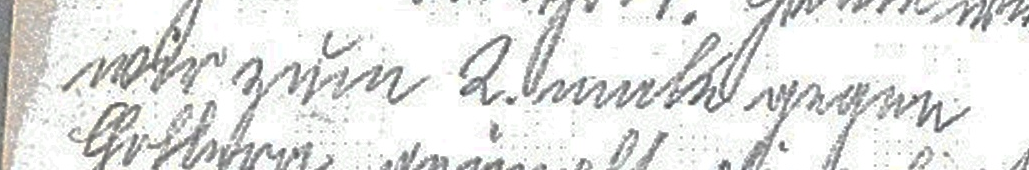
wir zum 2. mal gegen
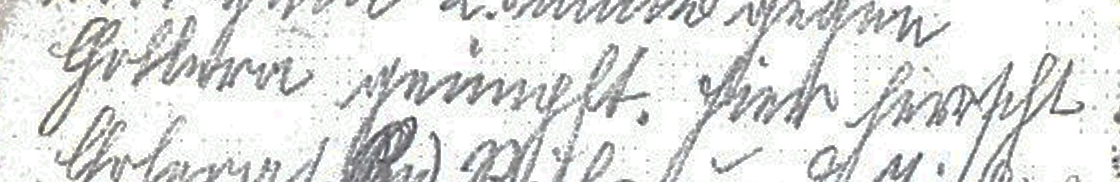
Cholera geimpft. Hier herrscht
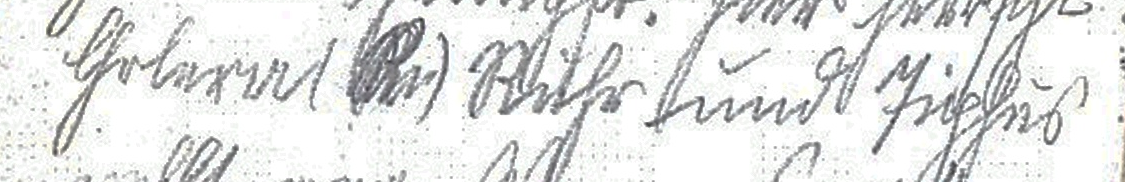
Cholera, Ruhr und Tiefus
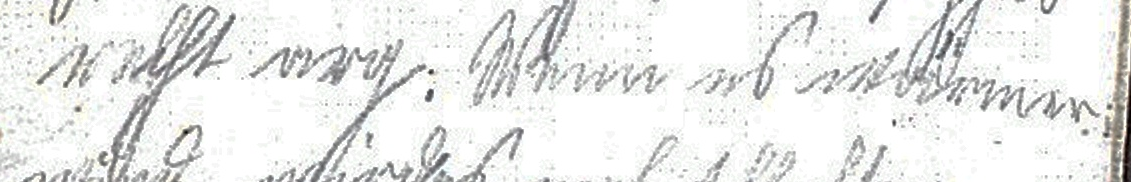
recht arg. Wenn es wärmer
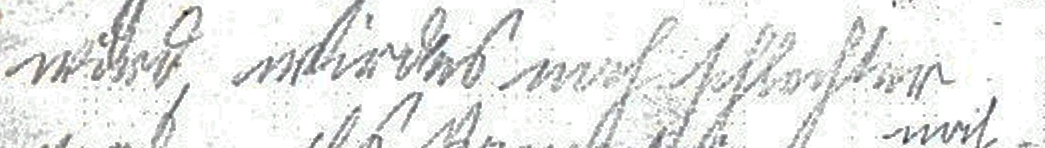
wird, wird es noch schlechter
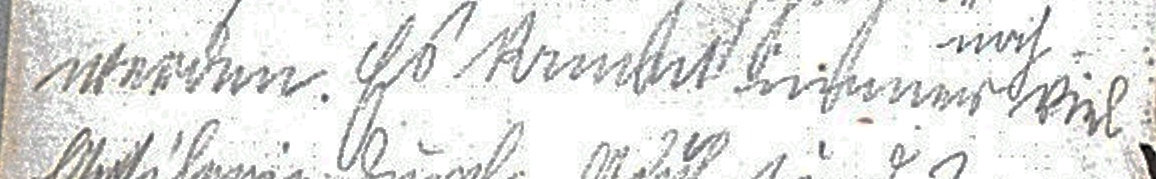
werden. Es kommt immer noch viel
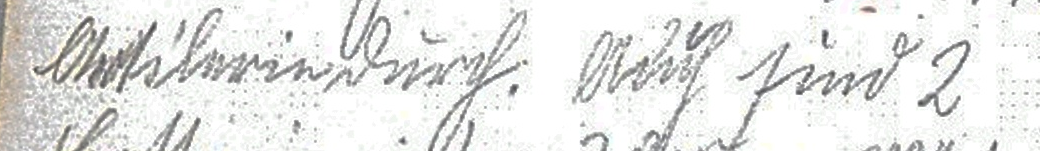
Artilerie durch. Auch sind 2
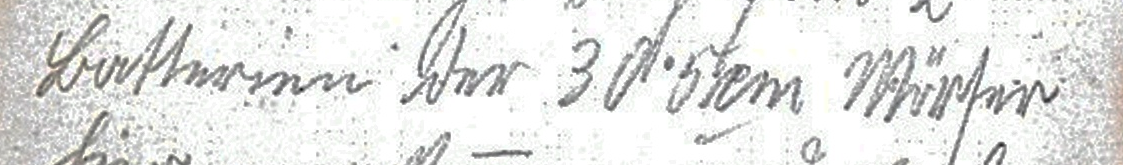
Batterien der 30.5 ern Mörser
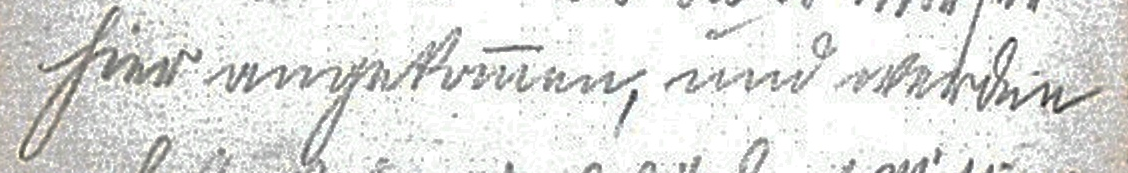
hier angekommen, und werden
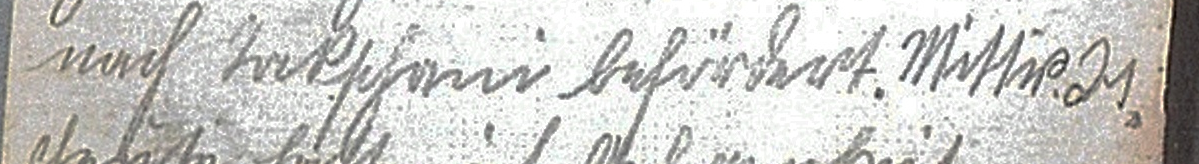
nach Takschani befördert. Mittw 21
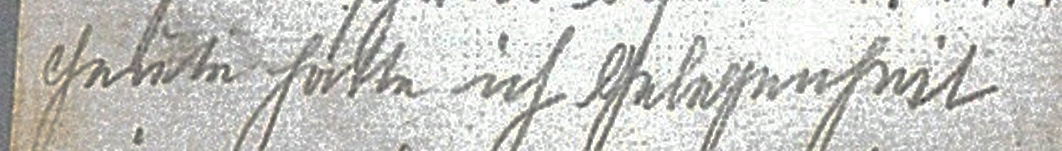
heute hatte ich Gelegenheit
